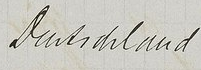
Deutschland
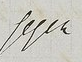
chen hat.
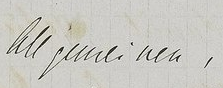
Allgemeinen, sagte
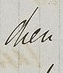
Berlin
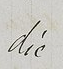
über
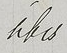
sitionen
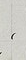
des
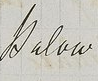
italien.
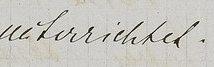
unterrichtet.
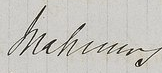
Mahnung
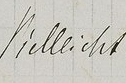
Marainis
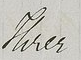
Seite
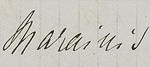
Platze. Es ist
